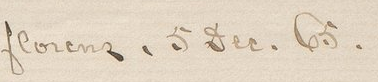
Florenz, 5 Dec. 65.
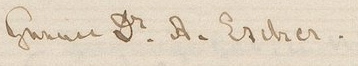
Herrn Dr A. Escher.
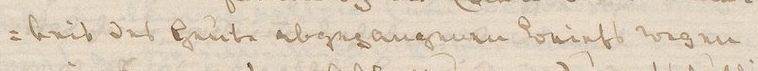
keit des heute abgegangenen Briefs wegen
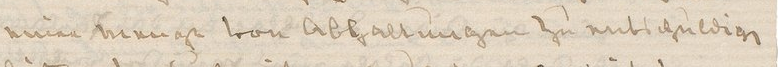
einer Menge von Abhaltungen zu entschuldigen
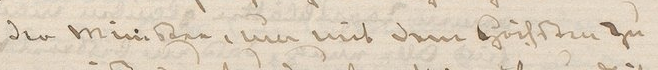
Der Minister, um mit dem Höchsten zu
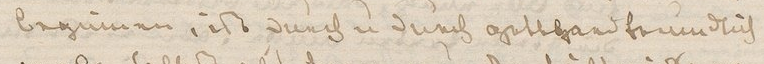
beginnen, ist durch u durch Gotthardfreundlich
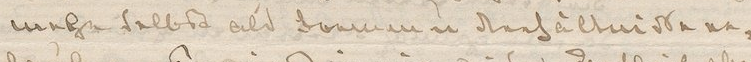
mehr selbst als Formen u Verhältnisse er-
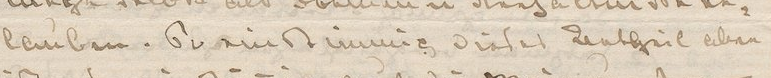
lauben. So einstimmig dieses Urtheil aber
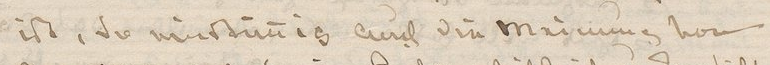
ist, so einstimmig auch die Meinung von
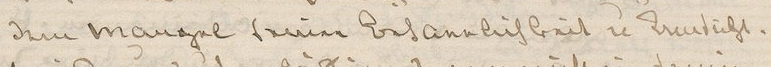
dem Mangel seiner Beharrlichkeit u Umsicht.
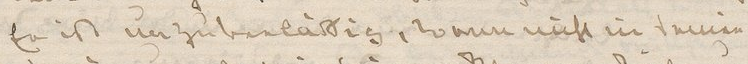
Er ist unzuverlässig, wenn nicht in seiner
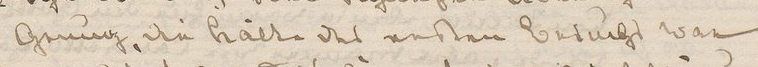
Genug, die Kälte des ersten Besuchs war
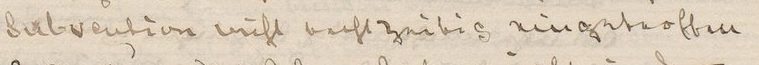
Subvention nicht rechtzeitig eingetroffen
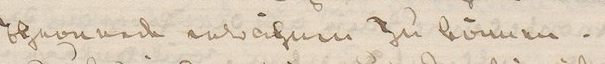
Thronrede erwähnen zu können.
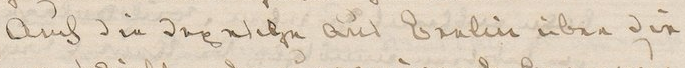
Auch die Depesche aus Berlin über die
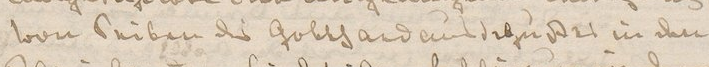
von Seiten des Gotthardausschußes in den
